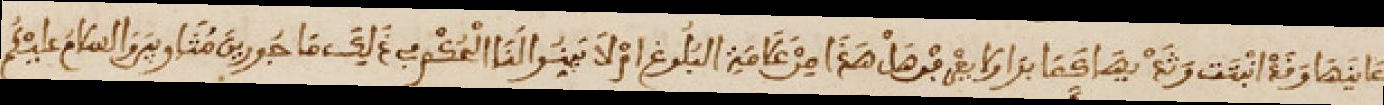عاينها وقد انبتت و ثديها كما بدا ولا يعرف هل هذا من علامات البلوغ ام لا بينوا لنا الحكم من ذلك ماجورين مثاوبين ان شاء الله السلام عليكم
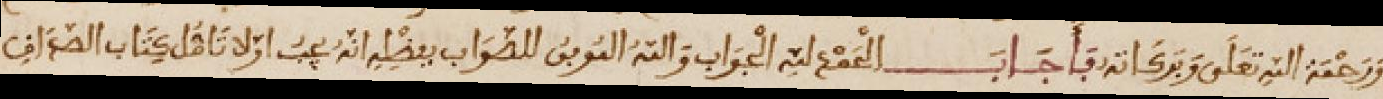ورحمه الله تعلى وبركاته فاجاب الحمد لله الجواب والله الموفق للصواب بفضله انه يجب اولا تامل كتاب الصداق
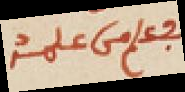في علم من علمه
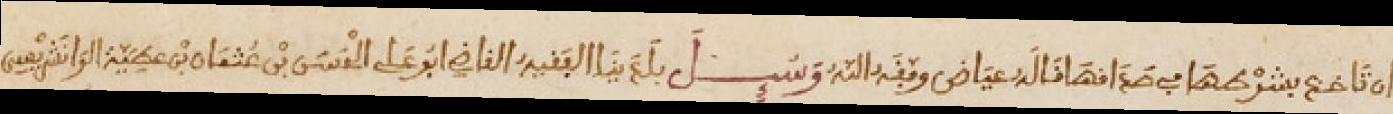ان تاخذ بشرطها في صداقها قاله عياض وفقه الله وسئل بلدينا الفقيه القاضي ابو علي الحسن بن عثمان بن عطية الوانشريسي
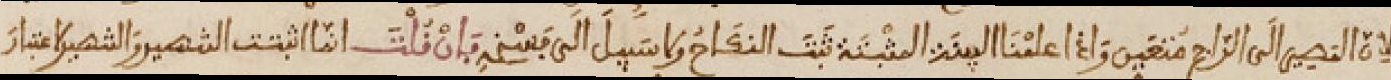لان المصير الى الراجح متعين واذا اعلمنا البينة المثبتة ثبت النكاح ولا سبيل الى فسخه فان قلت انها اثبتت التنهيد والتتهيد لا اعتبار
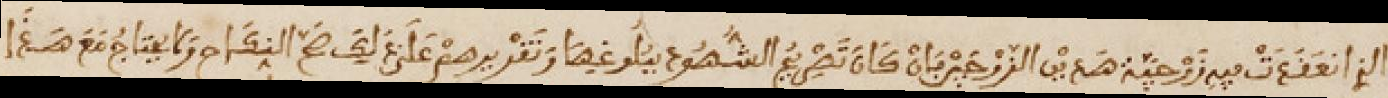الذي انعقدت فيه زوجية هدين الزوجين فان كان تصريح الشهود ببلوغها وتقريرهم على ذلك صح النكاح ولا يحتاج مع هذا
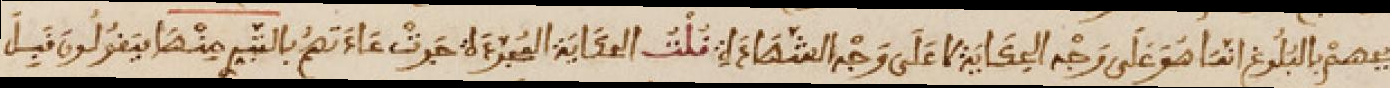يحهم بالبلوغ انما هو على وجه الحكاية لا على وجه الشهادة قلت الحكاية المجردة جرت عادتهم بالتبري منها فيقولون قبل
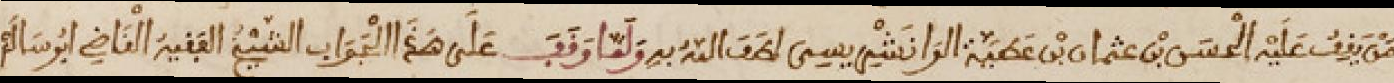من يقف عليه الحسن بن عثمان بن عطية الوانشريسي لطف الله به ولما وقف على هذا الجواب الشيخ الفقيه القاضي أبو سالم
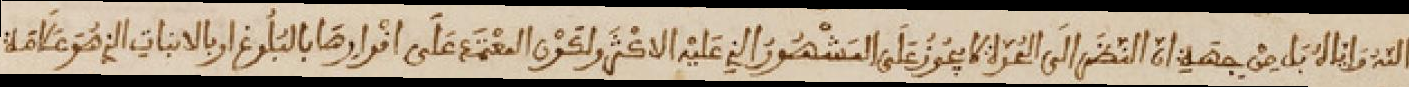الله واياه بل من جهة ان النظر الى الحرة لا يجوز على المشهور الذي عليه الاكثر ولكون المعتمد على اقرارها بالبلوغ او بالانبات الذي هو علامة
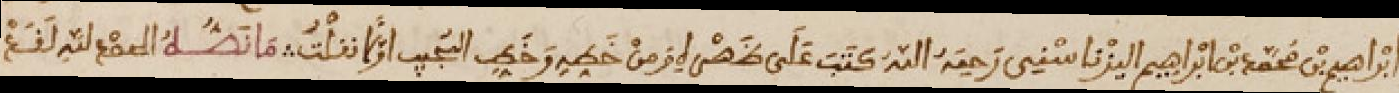ابراهيم بن محمد بن ابراهيم اليزناسني رحمه الله كتب على ظهره ومن خطه وخط المجيب اولا نقلت ما نصه الحمد لله لقد
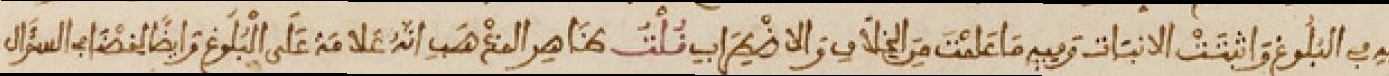به في البلوغ واثبتت الانبات وفيه ما علمت من الخلاف والاضطراب قلت ظاهر المذهب انه علامة على البلوغ وايضا لخصنا في السؤال
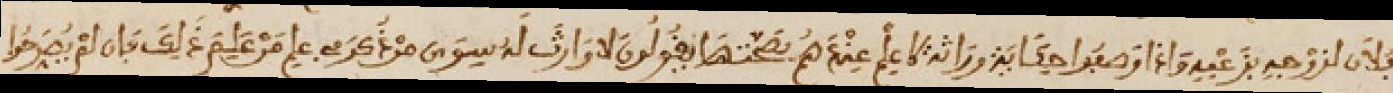فلان لزوجه بزعمه واذا وصفوا حكاية وراثة لا علم عندهم بصحتها يقولون لا وارث له سوى من ذكر في علم من علم ذلك فان لم يصرحوا
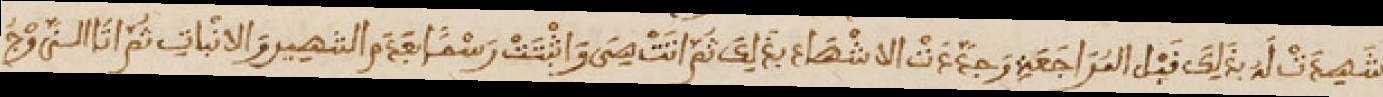شهدت له بذلك قبل المراجعه وجددت الاشهاد بذلك ثم اتت هي واثبتت رسما بعدم التنهيد والانبات ثم اتا الزوج
